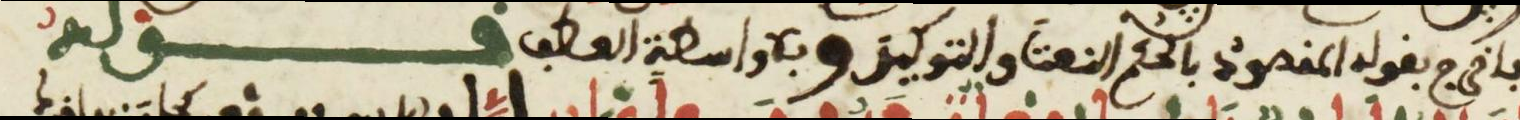فاخرج بقوله المقصود بالحكم النعت و التوكيد و بلا واسطة العطف و قوله
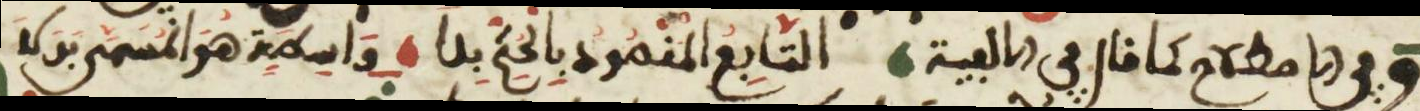و في الاصطلاح كما قال في الالفية التابع المقصود بالحكم بلا واسطة هو المسمى بدلا
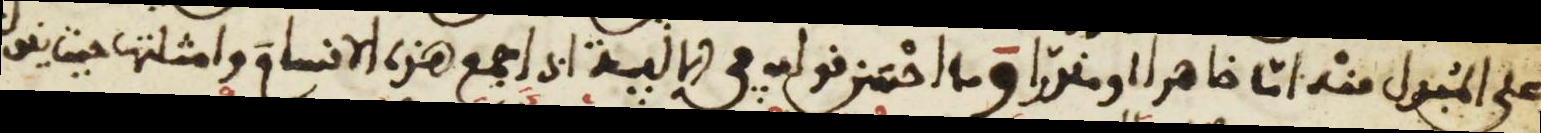على المبدل منه اما ظاهرا او مقدرا و ما احسن قوله في الالفية اذا جمع هذه الاقسام و امتثلت حيث يقول
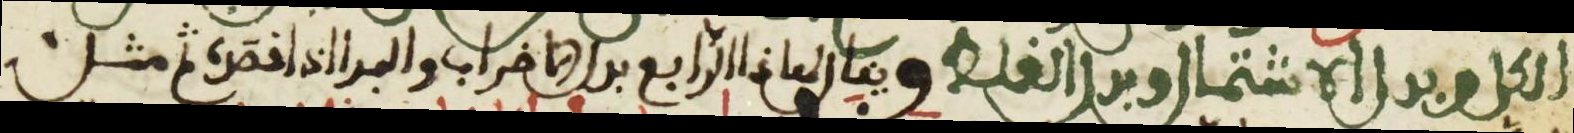الكل و بدل الاشتمال و بدل الغلط و يقال لمعاذا الرافع بدل الاضراب و المبدا اذا قصده ثم مثل
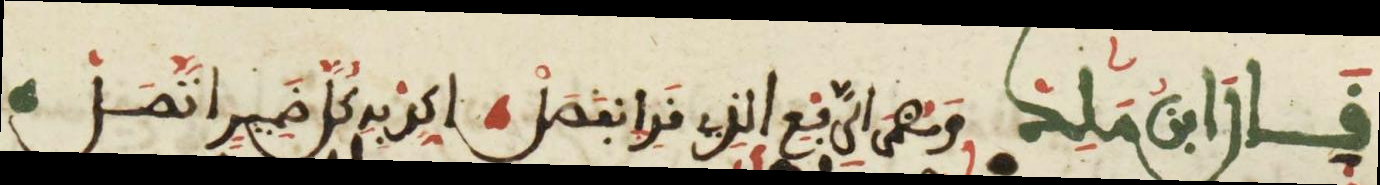قال ابن ملك و مضمر الرفع الذي قد انفصل اكد به كل ضمير اتصل
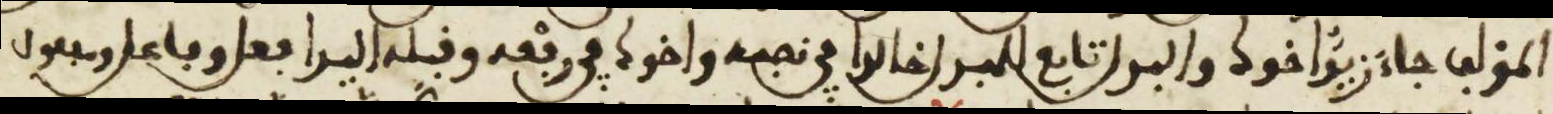المؤلف حاء زيد اخوك و البدل تابع للمبدل خالدا في نصبه و اخوك في رفعه و قبله اليدا فعل و فاعل و مفعول
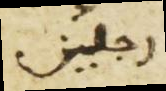رجلين
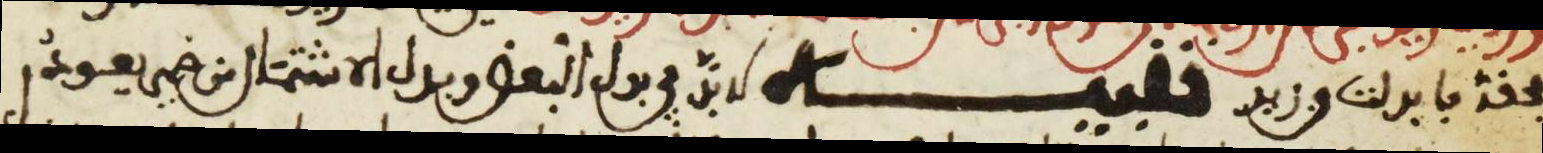فحقه فابدلت من زيد تنبيه لا بد في بدل البعض و بدل الاشتمال من ضمير يعو
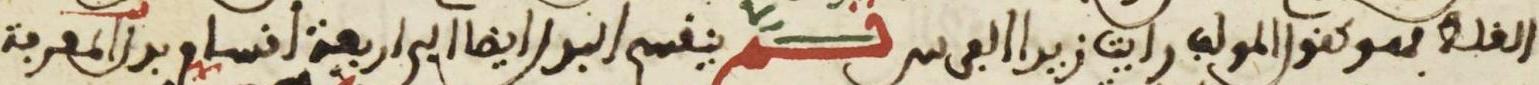الغلط فهو كقول المولف رايت زيدا الفرس ثم ينقسم البدل ايضا الى اربعة اقسام بدل المعرفة
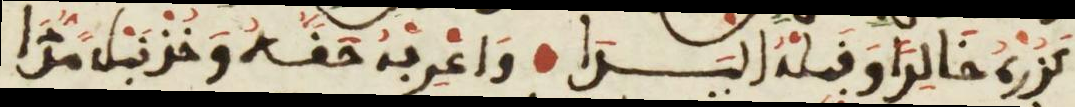كزره خالدا و قبله اليدا و اعرفه حقه و خذ نبلا مدا
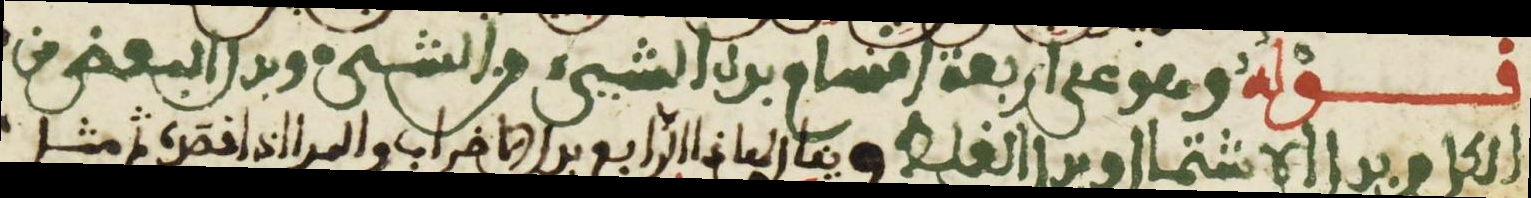قوله و هو على اربعة اقسام بدل الشيء من الشيء و بدل البعض من
